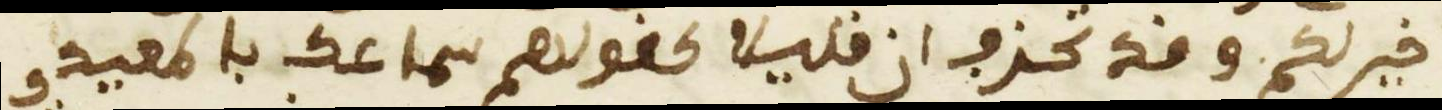خير لكم وقد تحزف ان قليلا كقولهم سماعك بالمعيد و
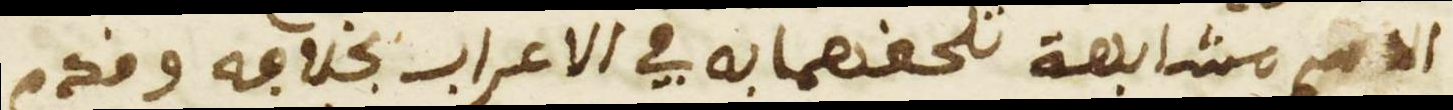الاسم مشابهة تلحقهما به في الاعراب بخلافه و قدم
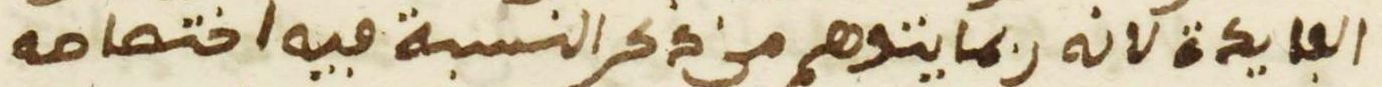الفايدة لانه ربما يتوهم من ذكر النسبة فيه اختصاصه
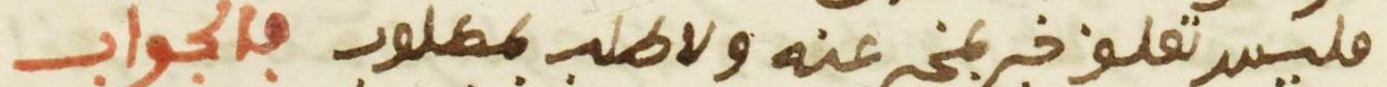فليس تعلق خبر بمخبر عنه ولا طلب بمطلوب فالجواب
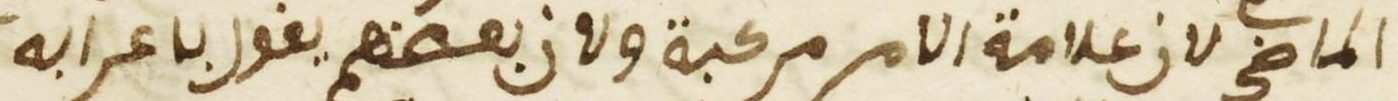الماضي لان علامة الامر مركبة ولأن بعضهم يقول باعرابه
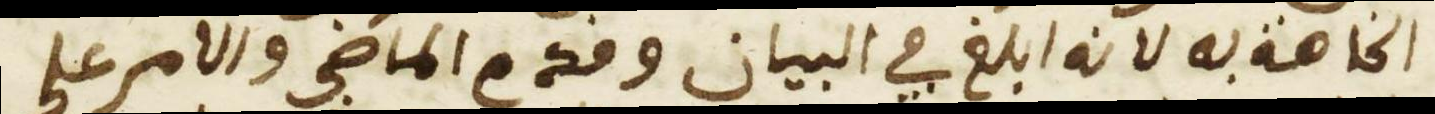الخاصة به لانه بلغ في البيان وقدم الماضي والأمرعلى
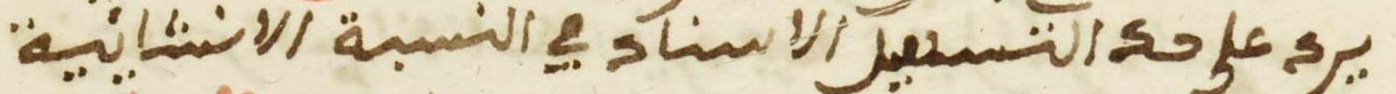يرد على حد التسهيل الاسناد في النسبة الانشائية
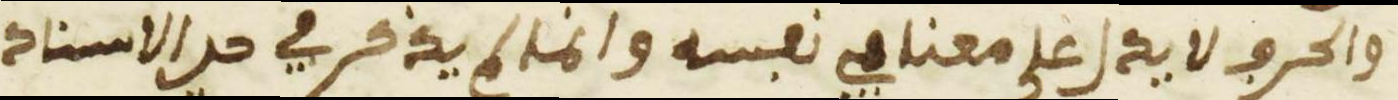والحرف لا يدل على معنا في نفسه وانما لم يذكر في حر الاسناد
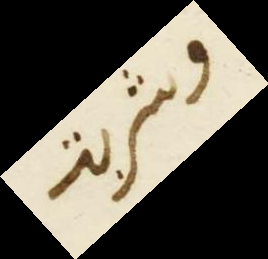وشربت
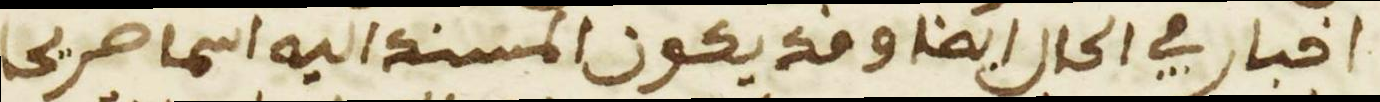اخبار في الحال ايضا وقد يكون المسند اليه اسما صريحا
